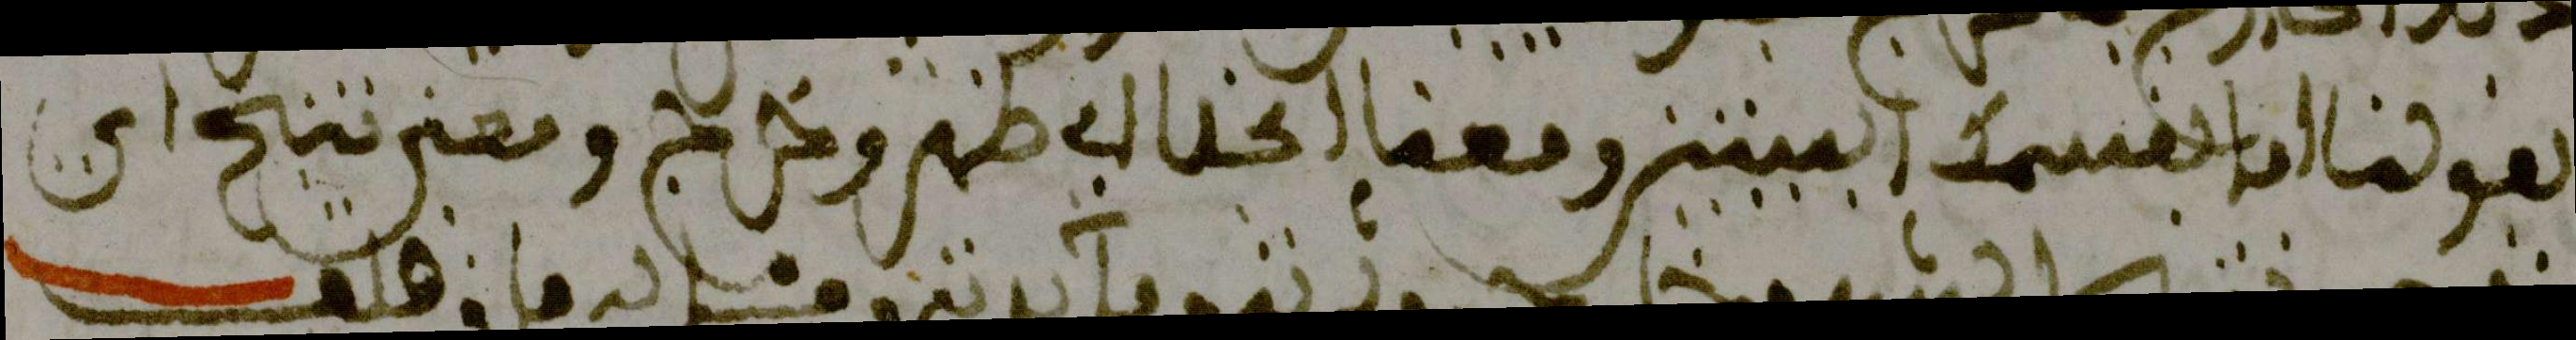بقولنا ما بقسمك البيتين ومعنا انجلا اي ظهر وخرج ومعنى نتج اي
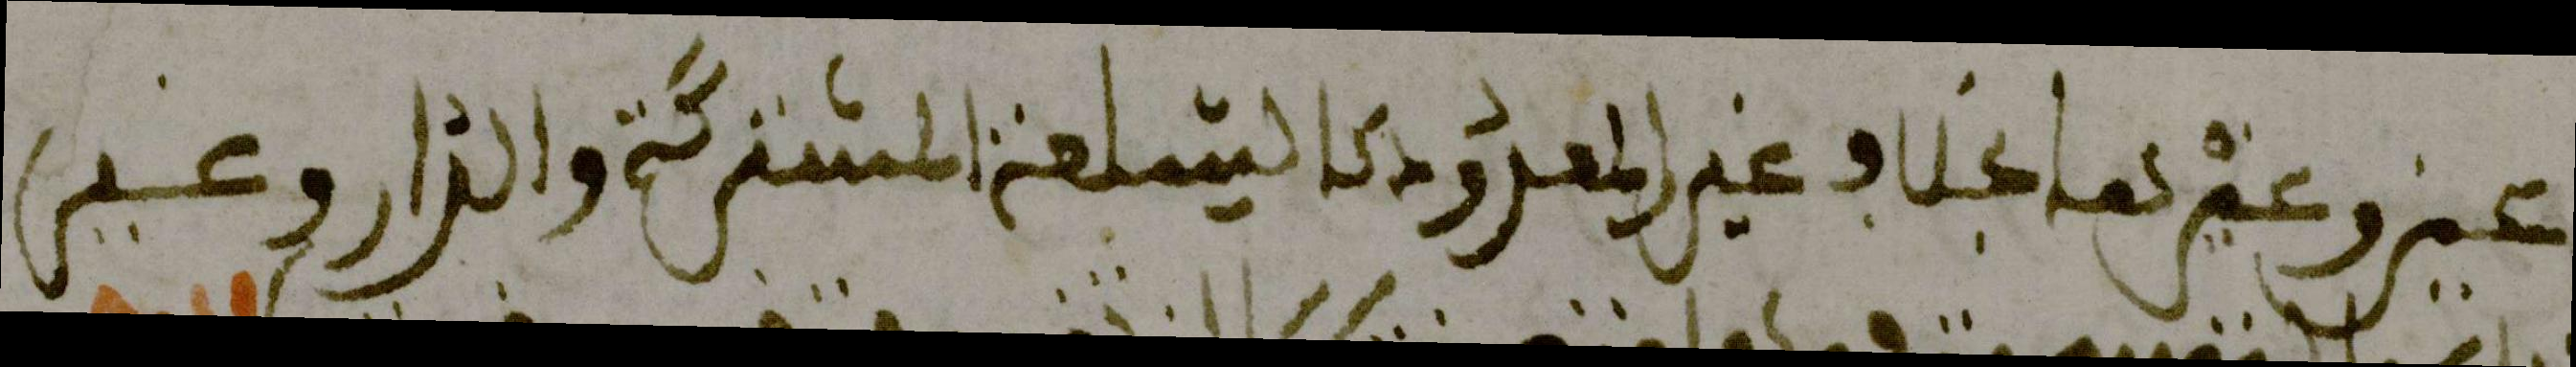عين وغيْرها بخلاف غير المعدودة كالسِّلعة المشتركة والدار وغير
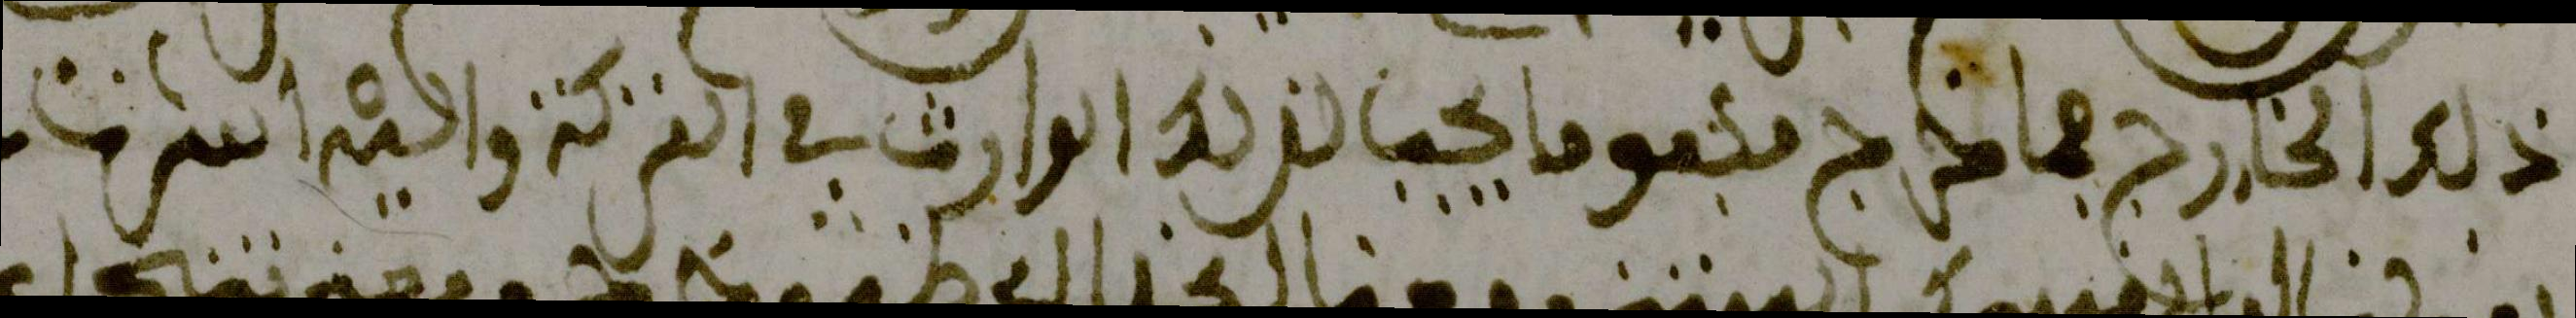ذلك الخارج فما خرج فهو ما يجب لذلك الوارث في التركة واليْه اشرن
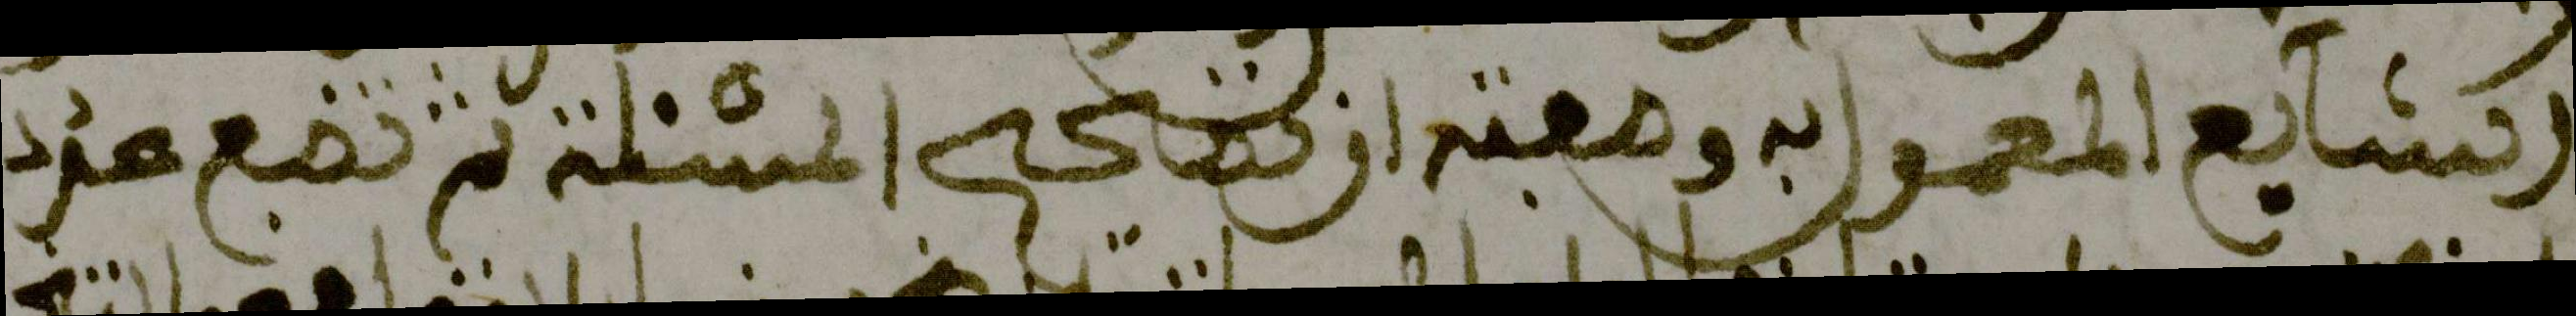الشائع المعمول به وصفته ان تصحيح المسْئلة ثم تضع عدد
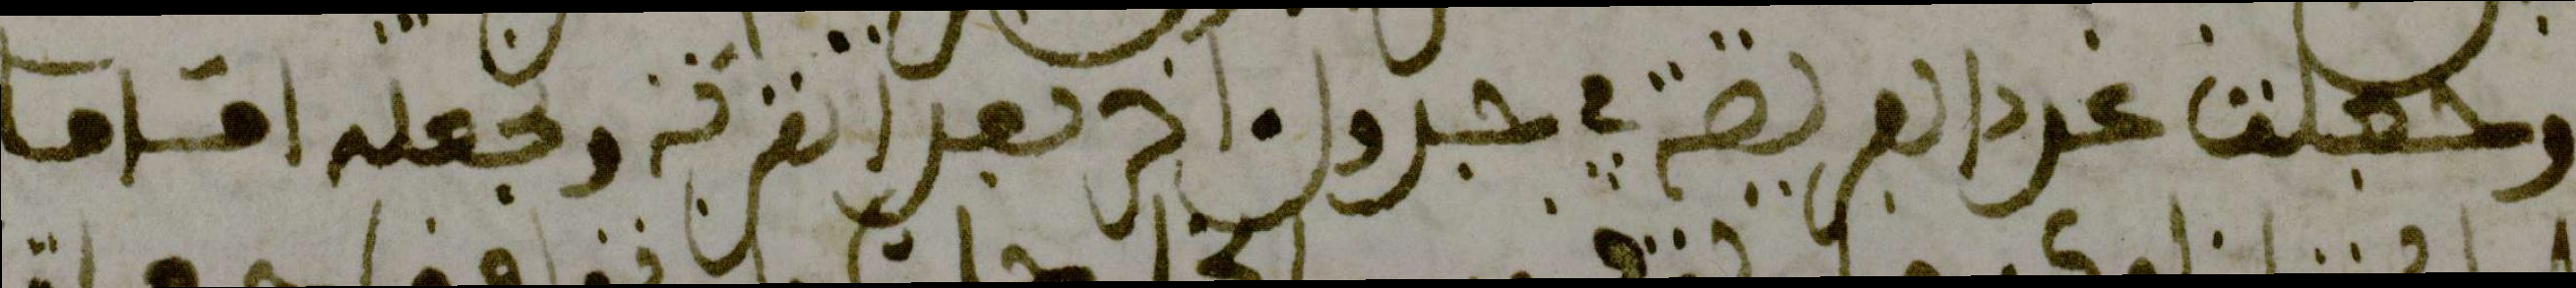وجعلت عدد الفريضة في جدول ءاخر بعد التركة وتجعله امَاما
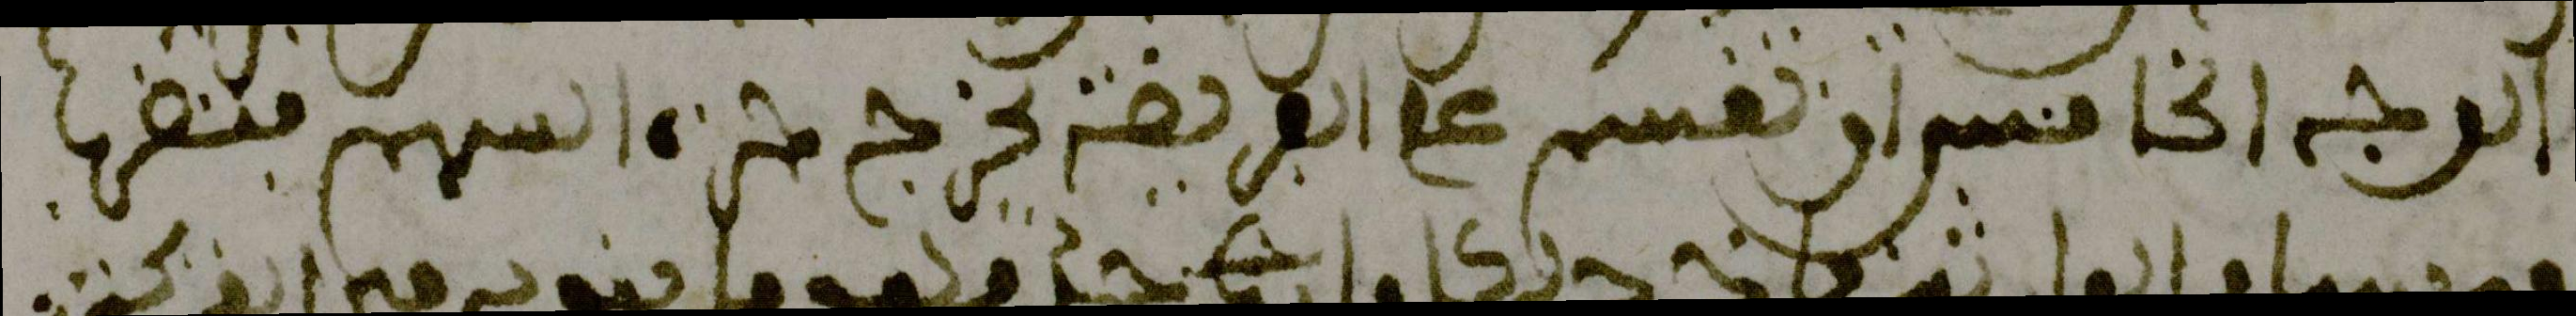الوجه الخامس ان تقسم على الفريضة يخرج جزء السهم فتضرب
